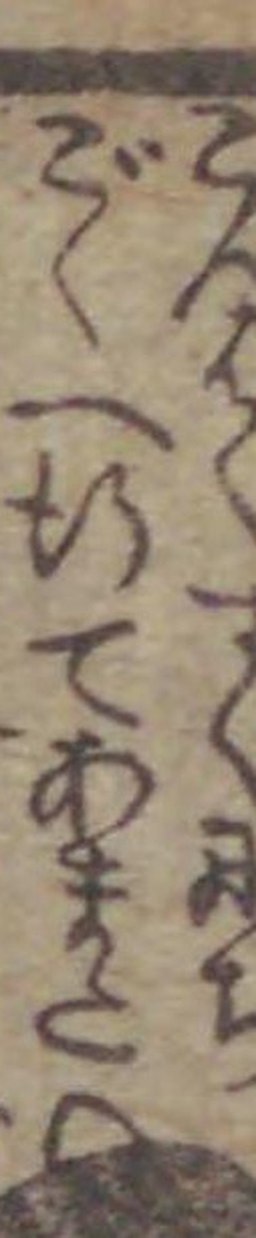ごくへ行てあまた
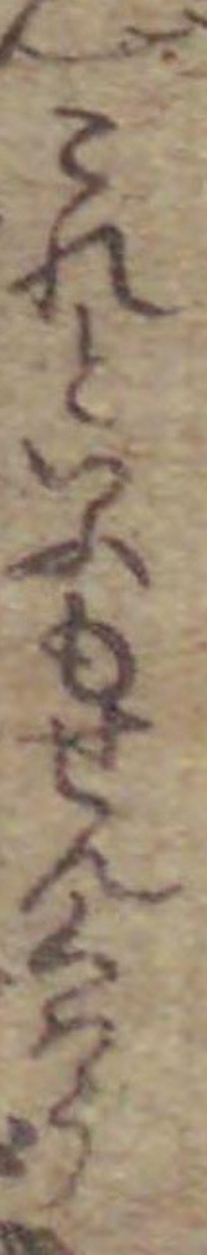これといふもせんくわう
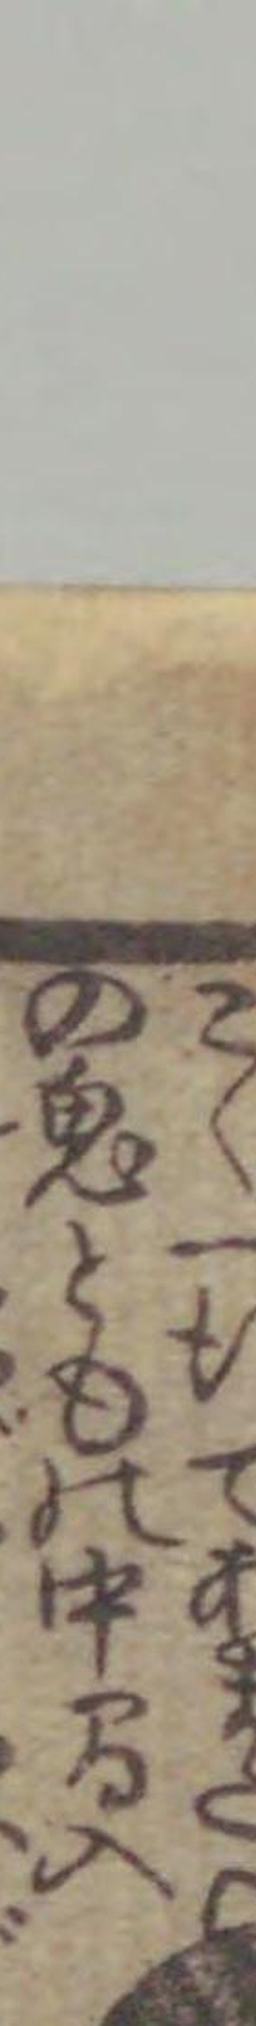の鬼ともの中間入
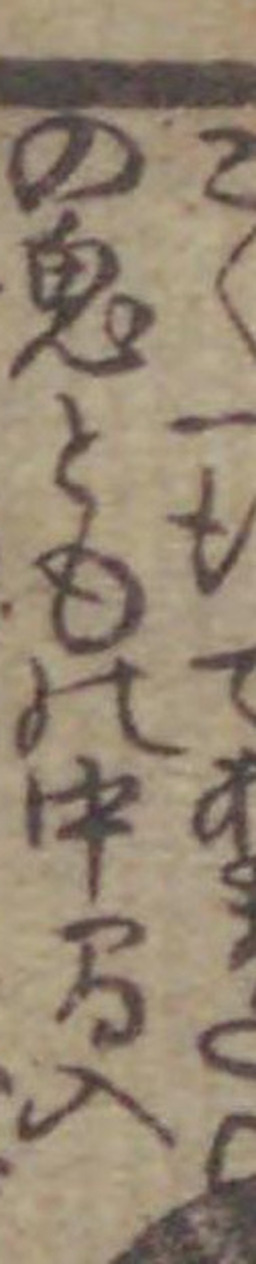の鬼ともの中間入
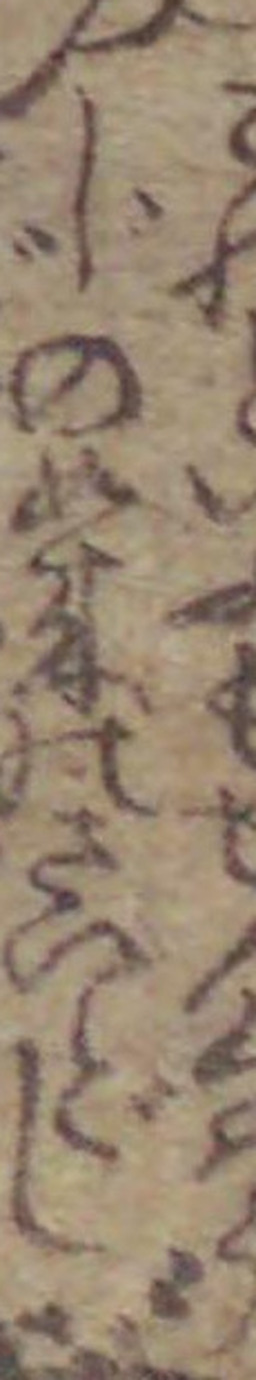じの如来のさいどし
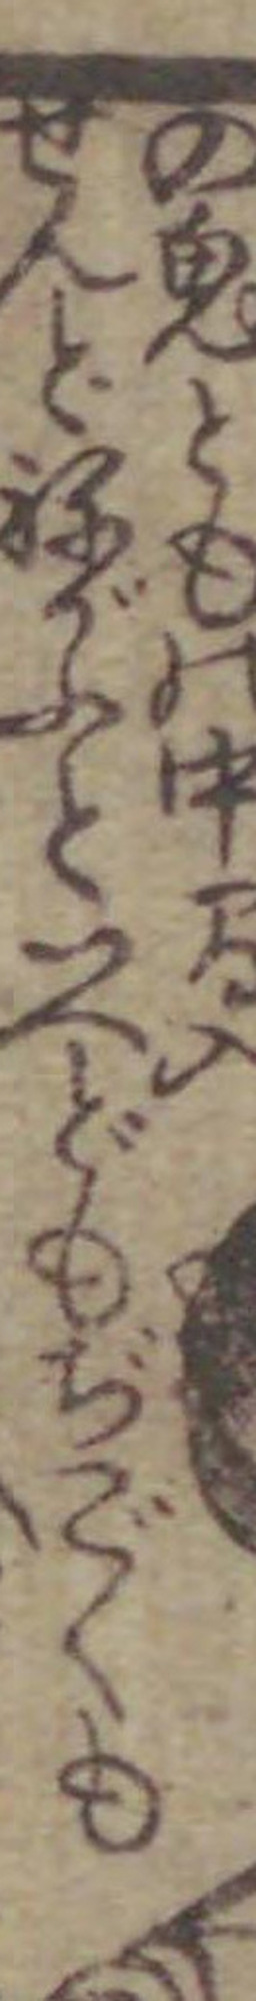せんとねがふといへどもぢごくも
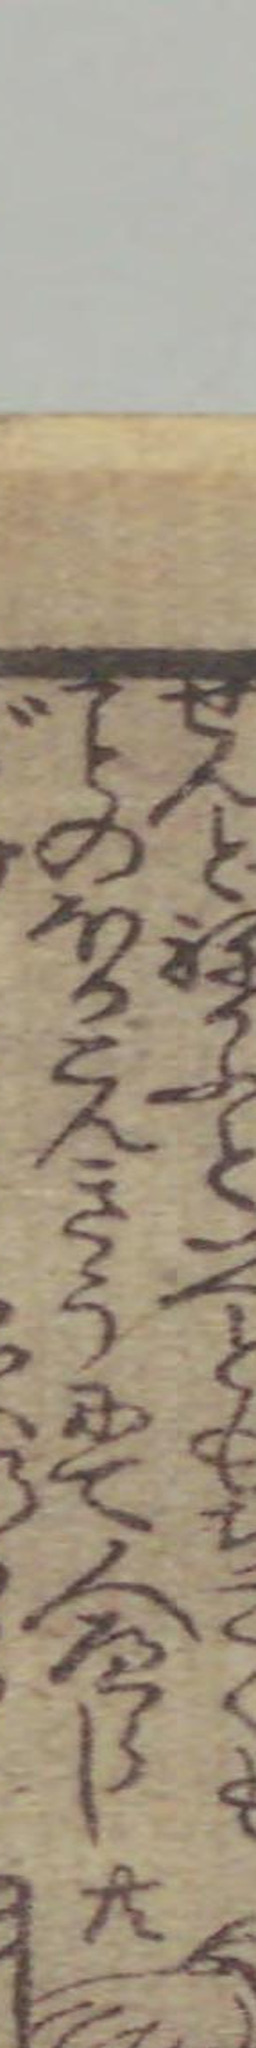ことのほかこんきうにて人へらし共
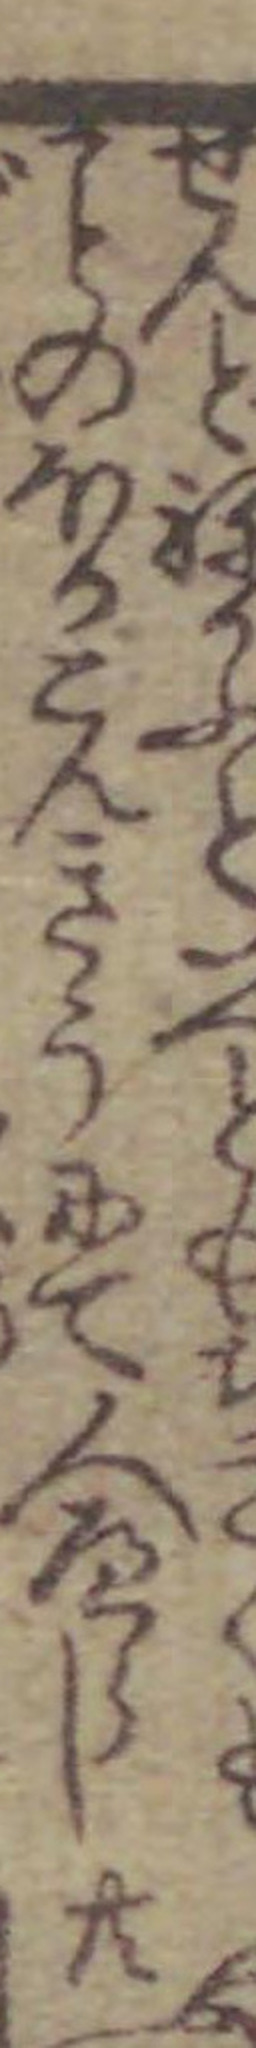ことのほかこんきうにて人へらし共
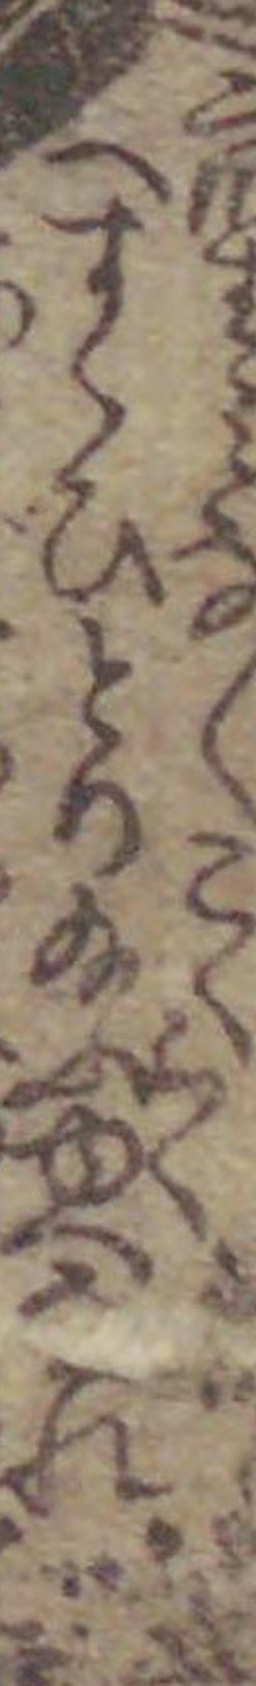へすくひとり給ふゆへなれば
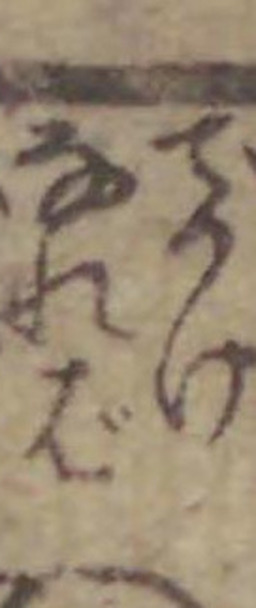なれば
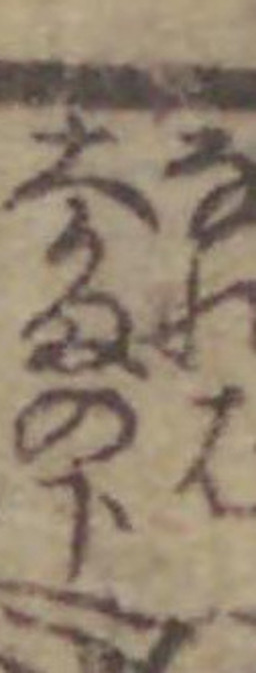大かまの下
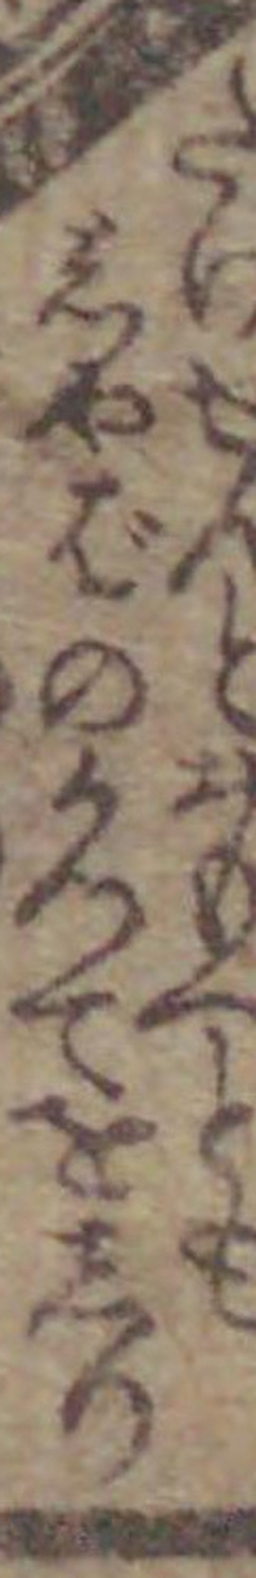しやばのかつてをしり
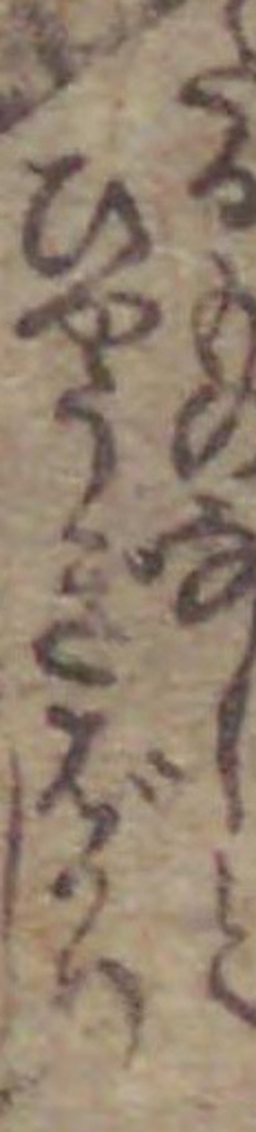ひやうきばかり
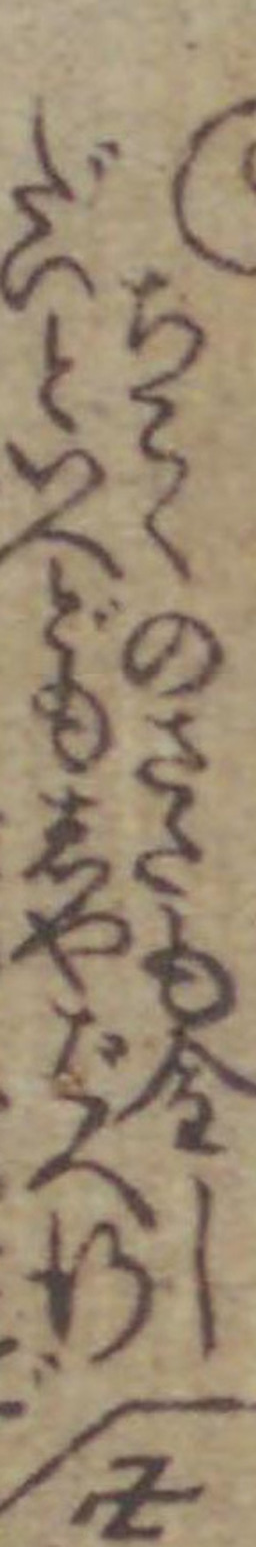だいといへどもしやばへ行
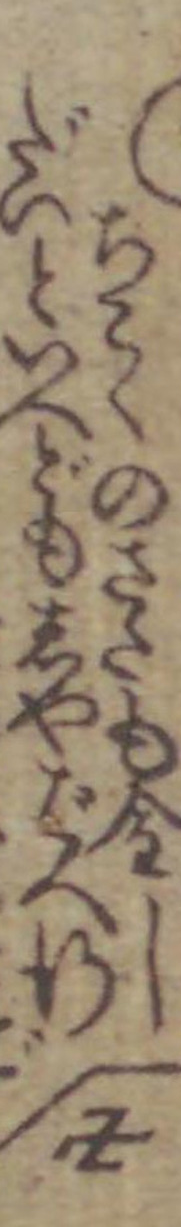だいといへどもしやばへ行
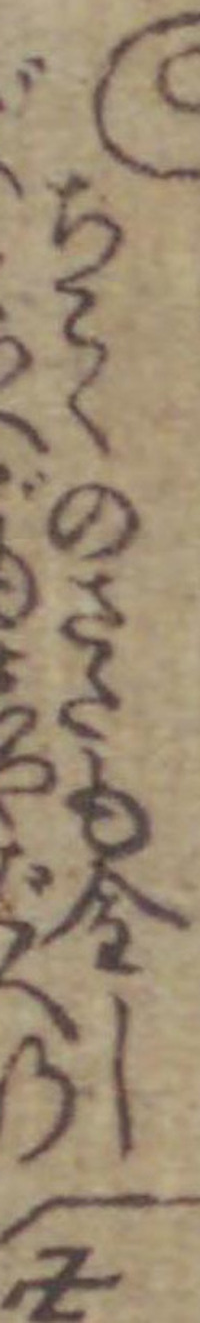ちこくのさたも金し
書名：鬼の趣向草 2巻
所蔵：国立国会図書館 National Diet Library, JAPAN
